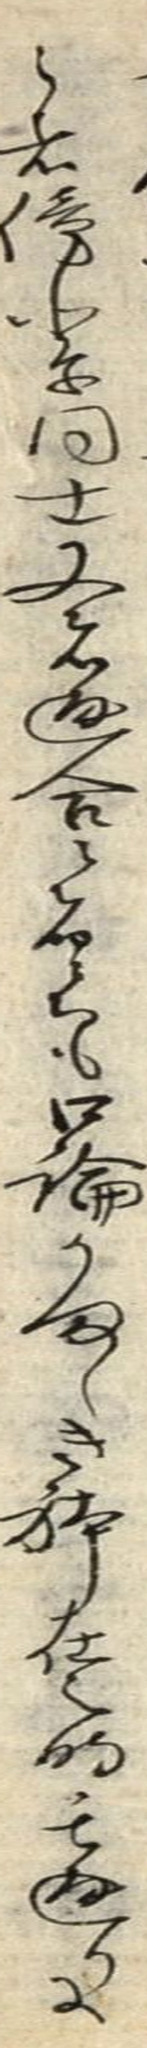之者傍輩同志又者通合之者にても口論かましき体在之時其通りに
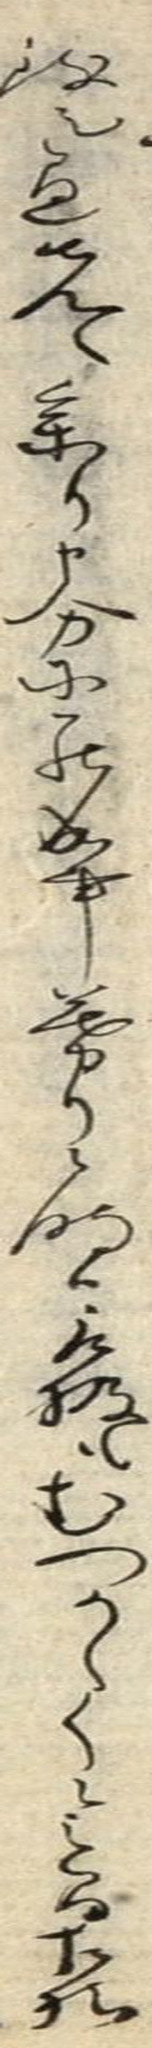致し置先へ参り申分に罷成事募り候時は取扱もむつかしく候之間左様
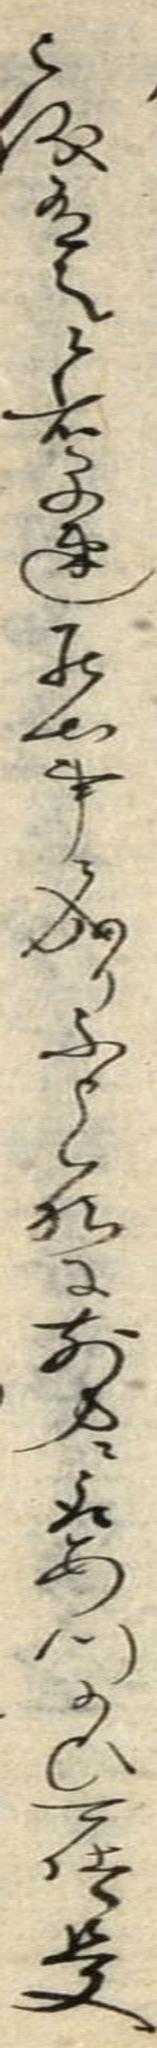之儀有之候者早速罷出事に成り不申候様に前方に取あつかひ可仕候且又
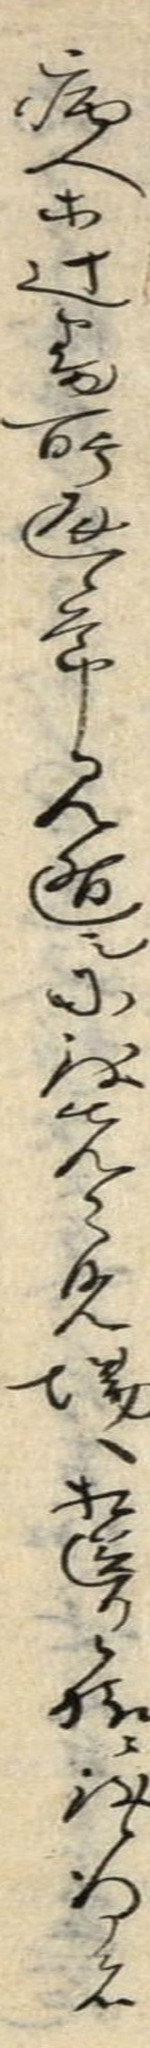病人抔辻番所通候節見遁しに致先々見場へ相送り候様に致候得は

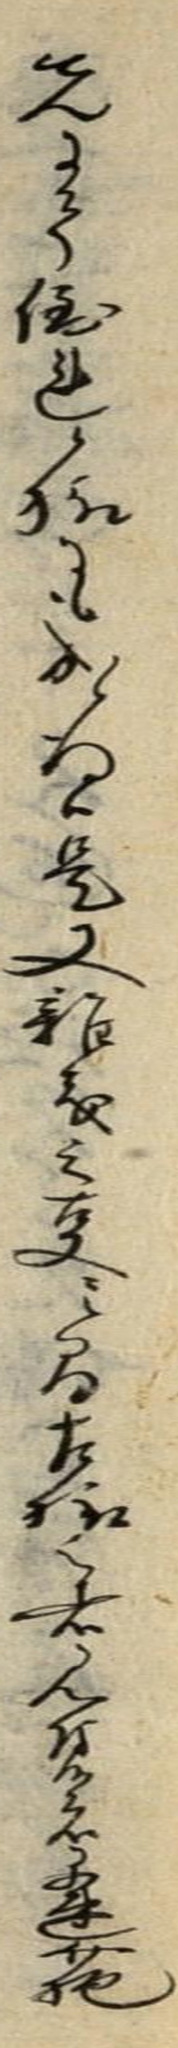先にて倒れ候様にも成候得は是又難義之事に候間左様之者見付候者早速介抱
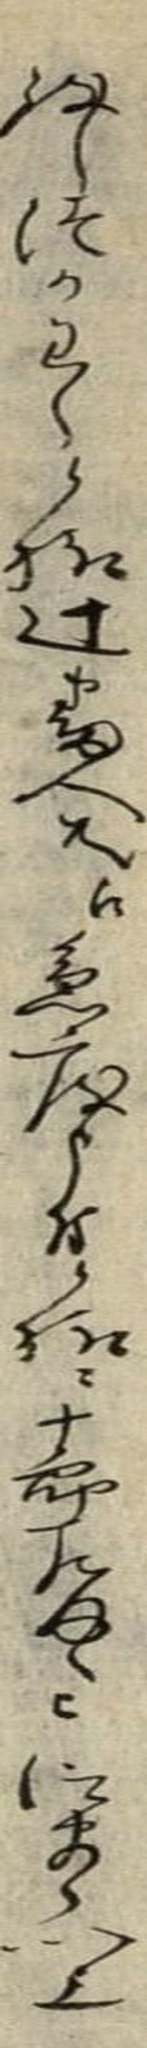致しつかわし候様辻番人共江急度申付候様に十郎左衛門へ被仰聞候以上
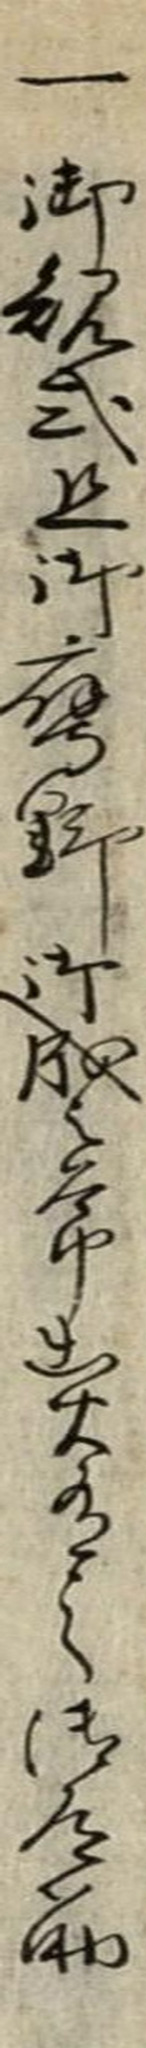一御規式且御鷹野御成之節出火有之御道筋
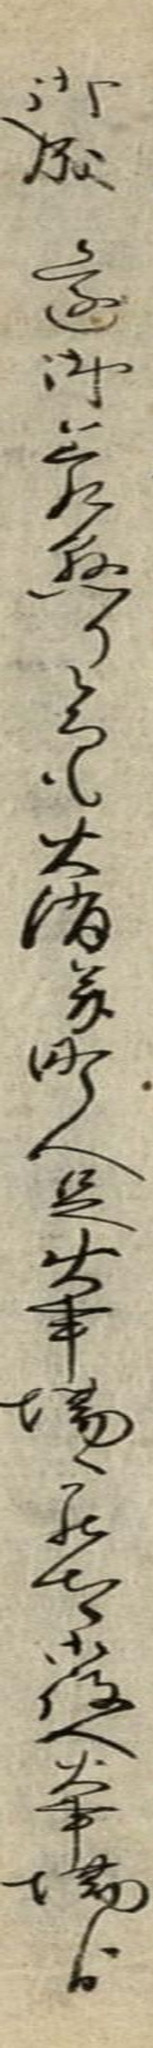御成還御差懸り候ても火消幷町人足火事場へ罷出候御役人火事場ゟ
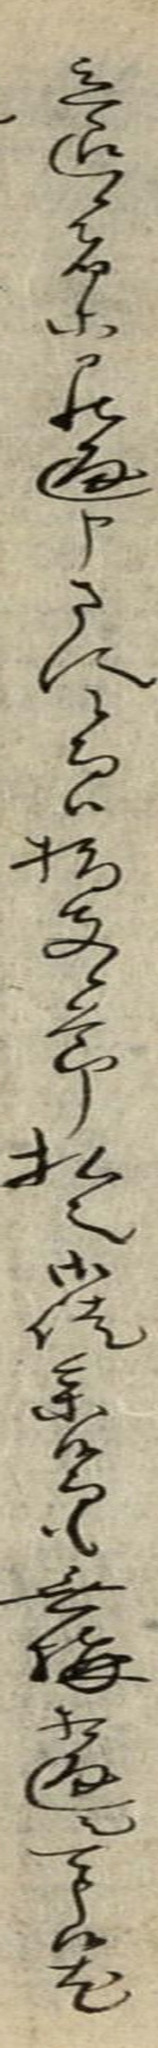立退候者等罷通申さす候ては指支候節払之御徒参候ても無構相通し可申候尤
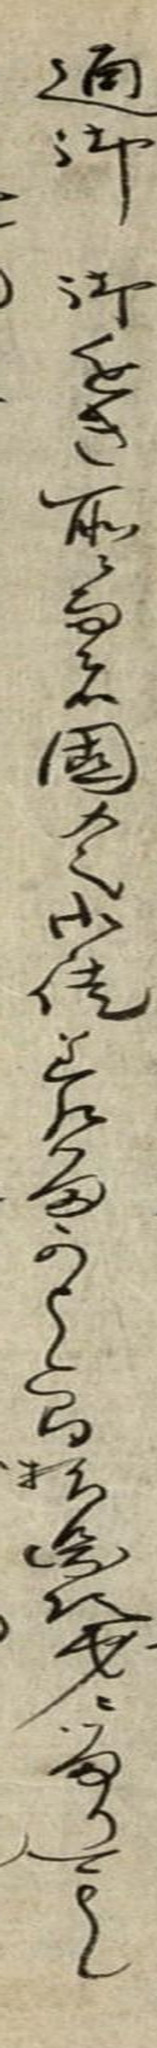通御御近き所にては固め之御徒差留可申候間指図次第に留り可申候
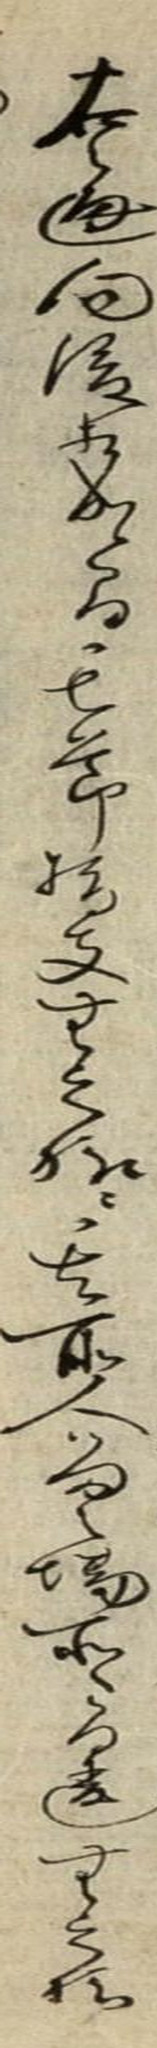右之通向後相成候間其節指支無之様に其所人留之場所へ間違無之様
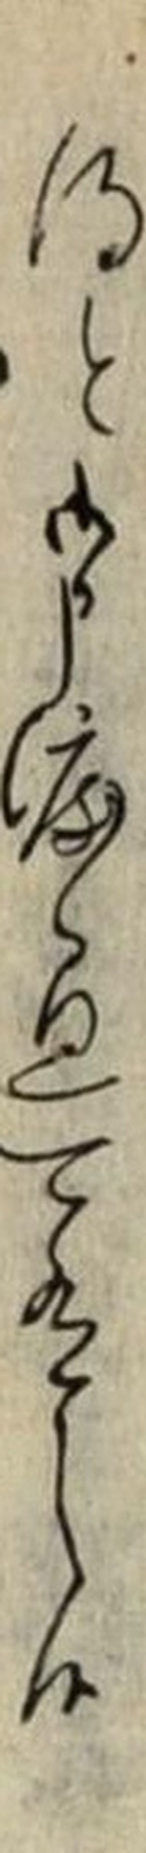得と御申渡置可有之候
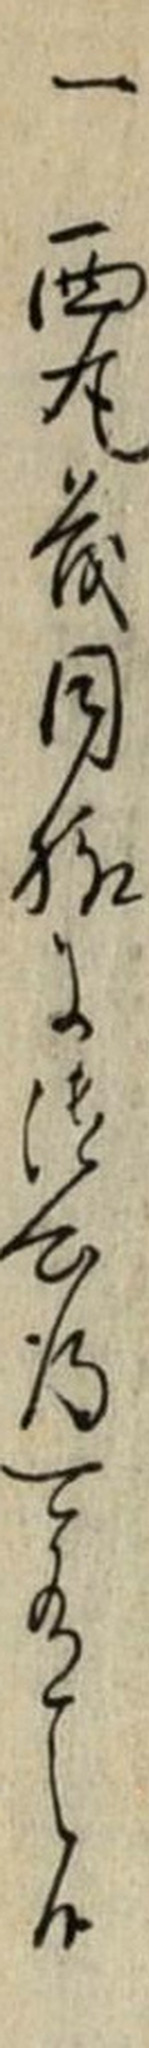一西丸も同様に御心得可有之候
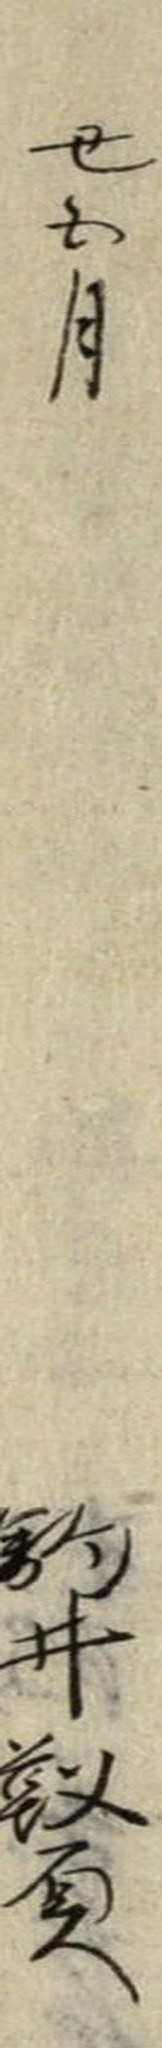丑五月駒井靫負
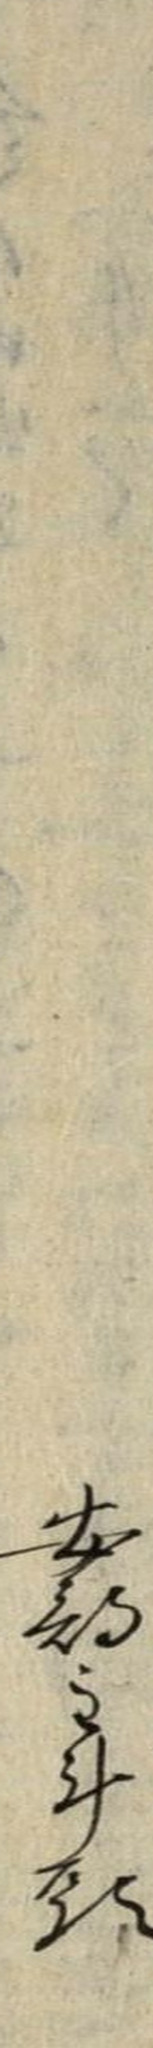阿部主計頭
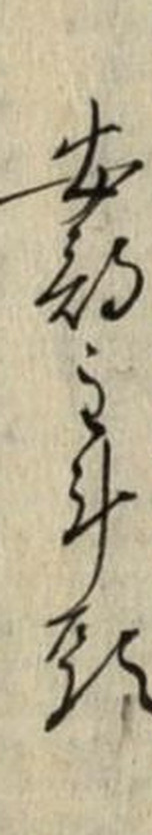阿部主計頭
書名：三都并道中之部
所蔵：福井県文書館 Fukui Prefectural Archives
